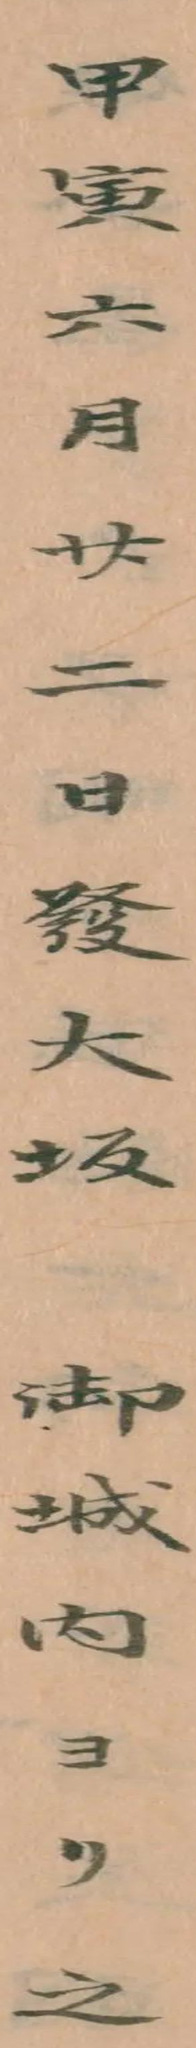甲寅六月廿二日発大坂御城内ヨリ之
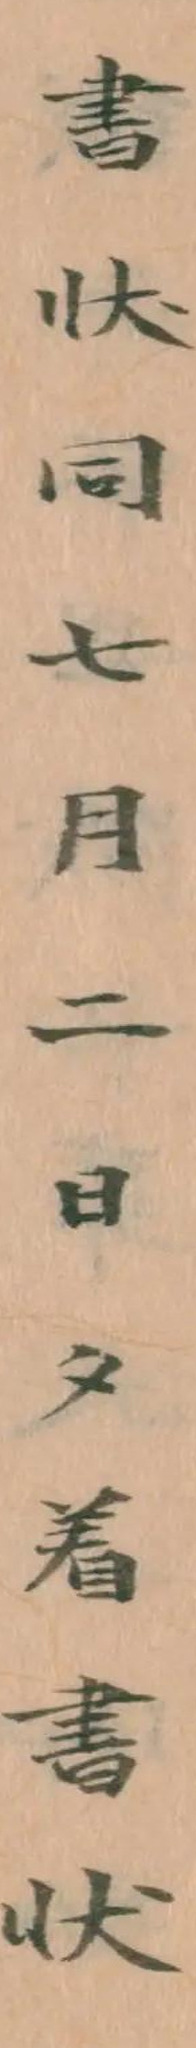書状同七月二日夕着書状
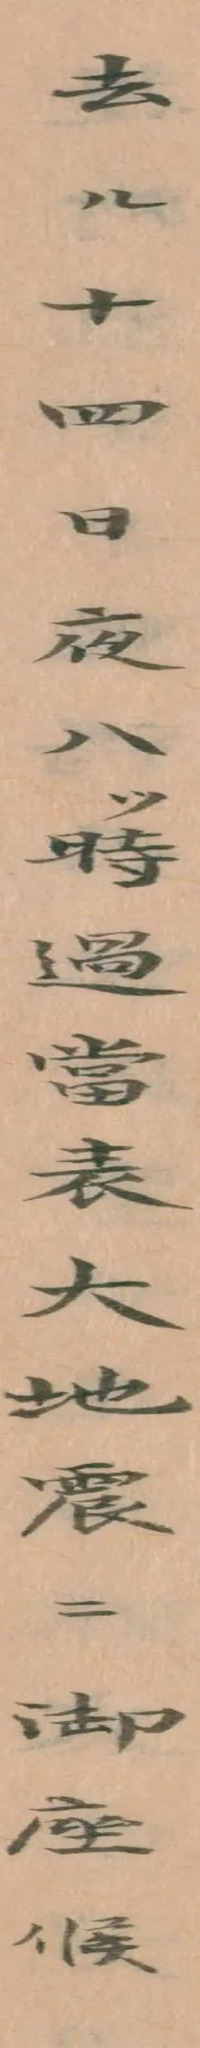一去ㇽ十四日夜八ッ時過当表大地震二御座候
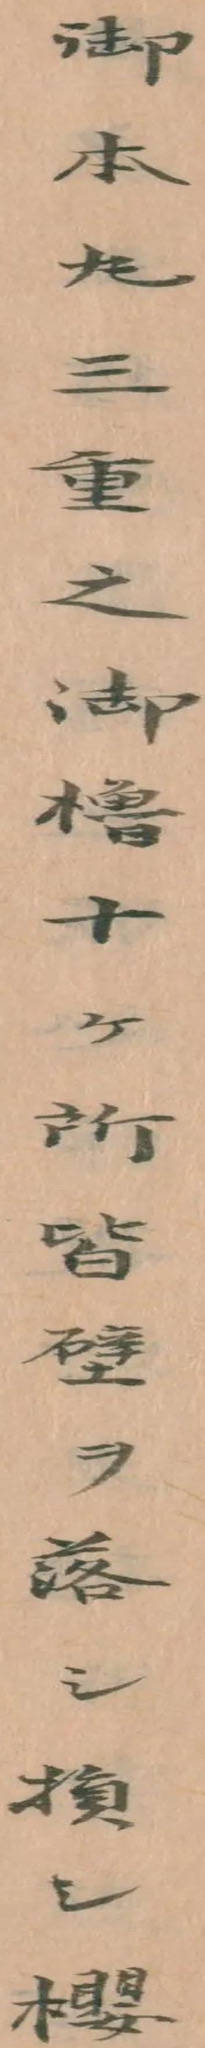御本丸三重之御櫓十ヶ所皆壁ヲ落シ損シ桜
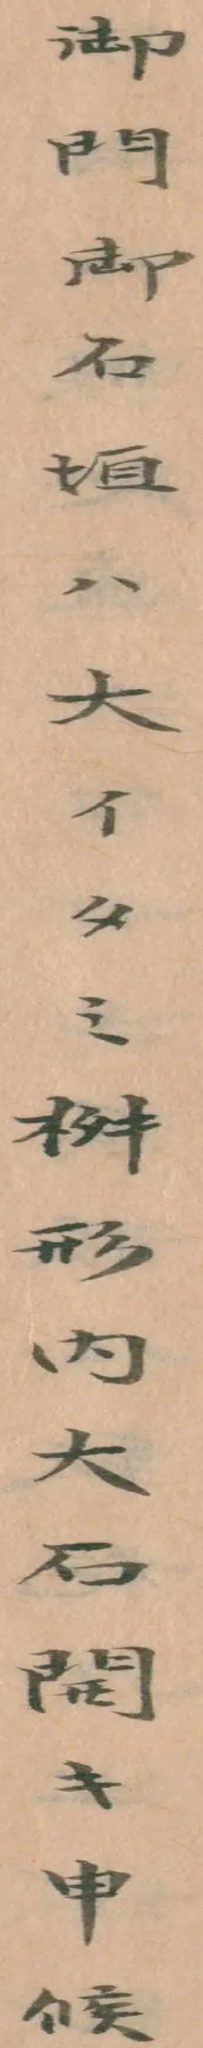御門御石垣ハ大イタミ桝形内大石開キ申候
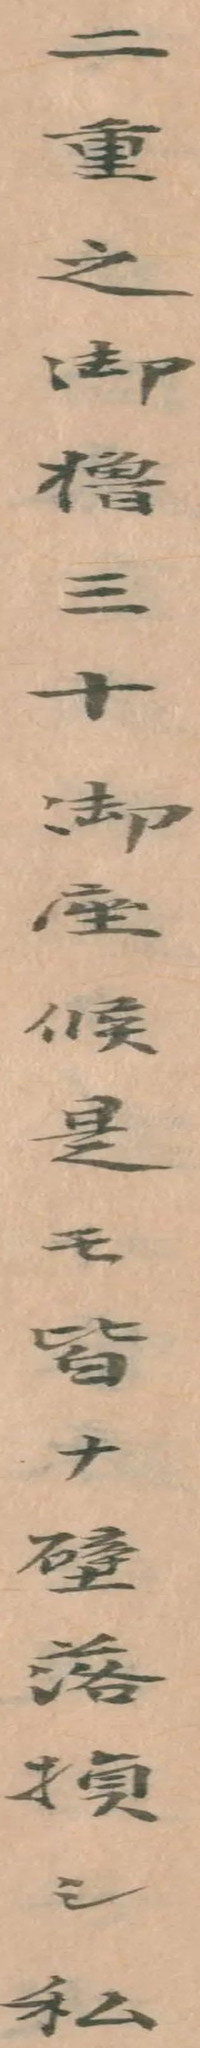二重之御櫓三十御座候是モ皆ナ壁落損シ私
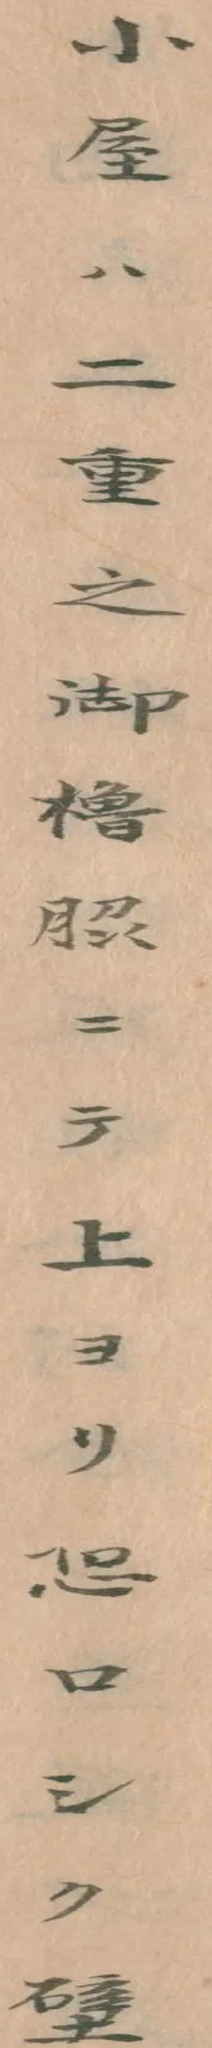小屋ハ二重之御櫓脇ニテ上ヨリ恐ロシク壁
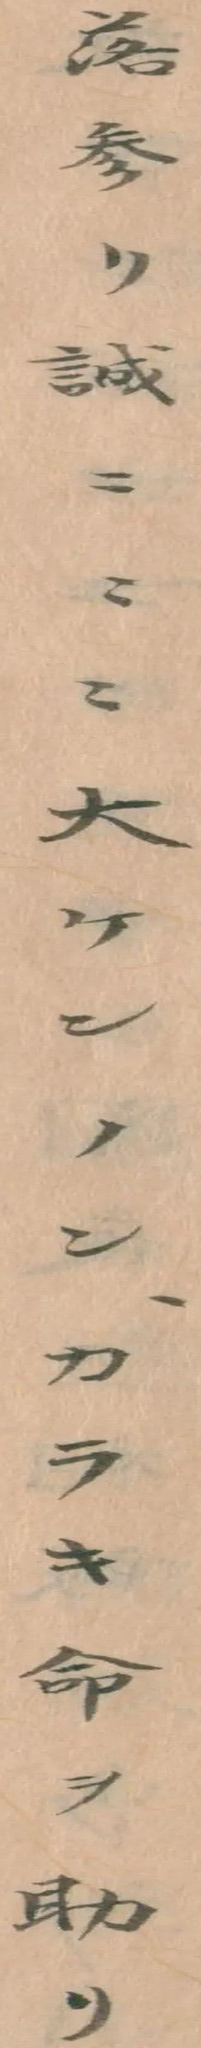落参り誠二々々大ケンノンカラキ命ヲ助り
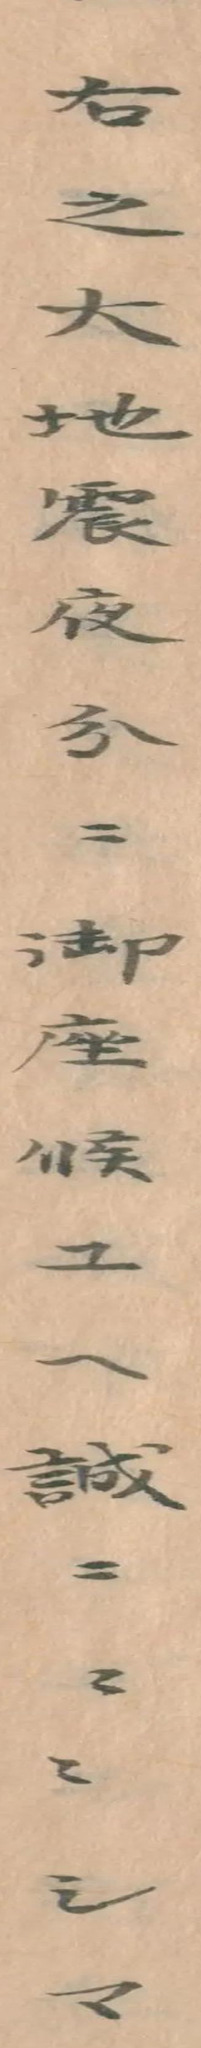一右之大地震夜分二御座候ユヘ誠二々々シマ

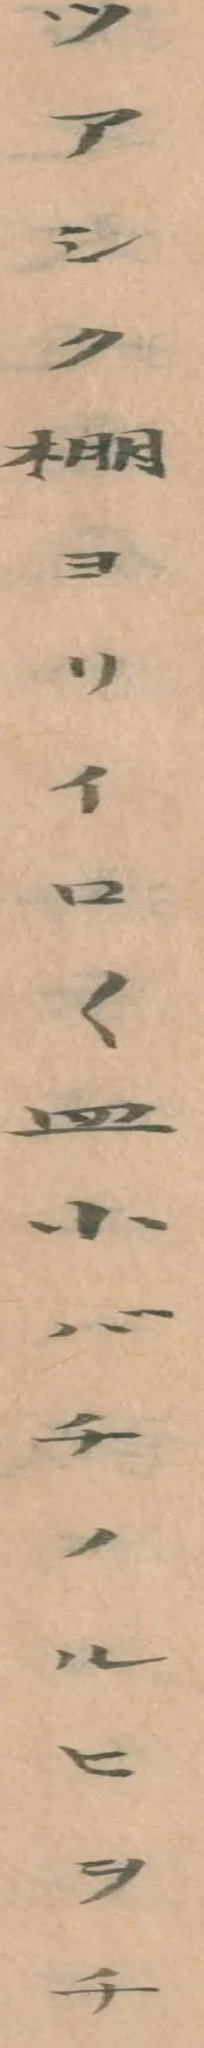ツアシク棚ヨリイロ〳〵皿小バチノルヒヲチ
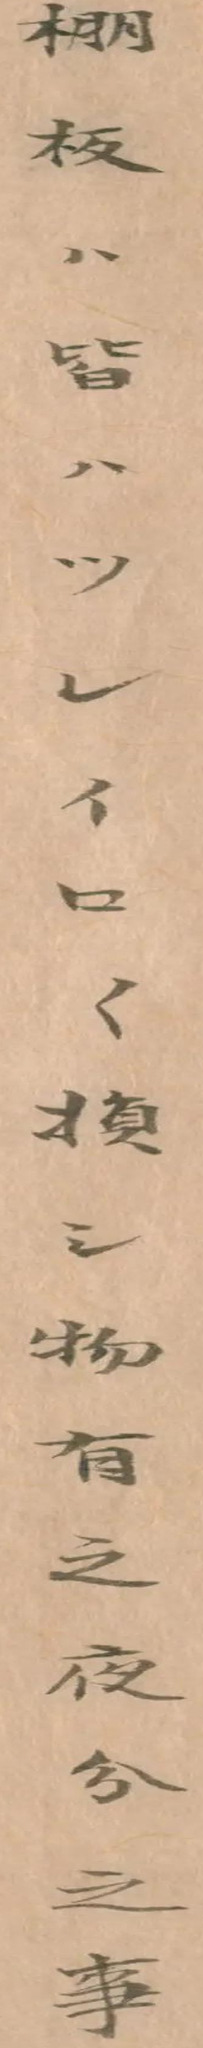棚板ハ皆ハツレイロ〳〵損シ物有之夜分之事
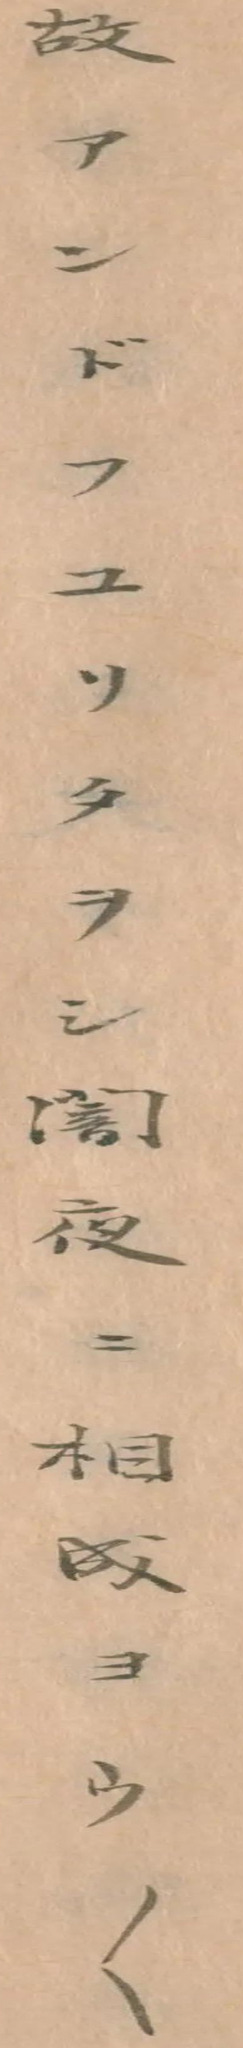故アンドフユリタヲシ闇夜二相成ヨウ〳〵
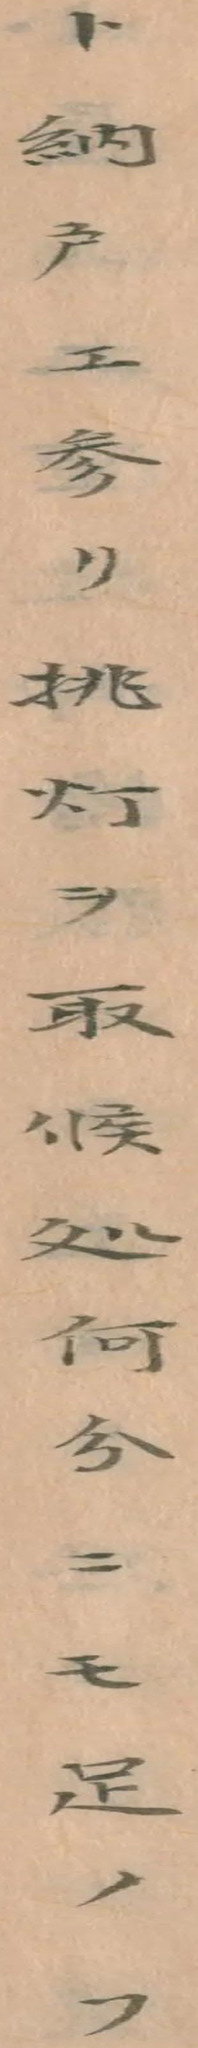ト納戸エ参り挑灯ヲ取候処何分ニモ足ノフ
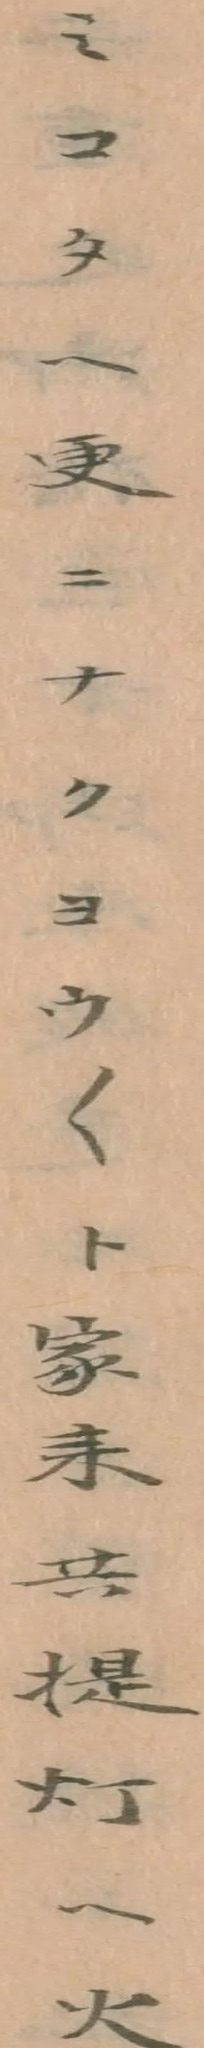ミコタへ更二ナクヨク〳〵ト家来共提灯へ火
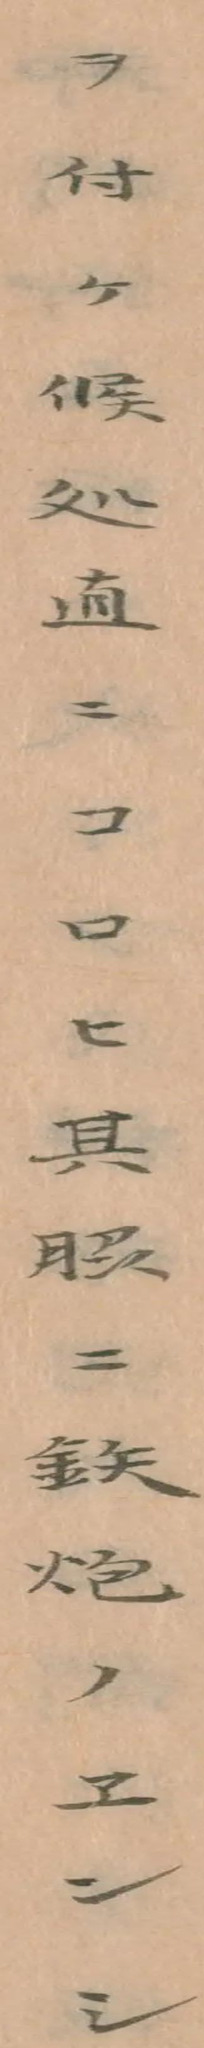ヲ付テ候処直二コロヒ其脇二鉄炮ノエんシ
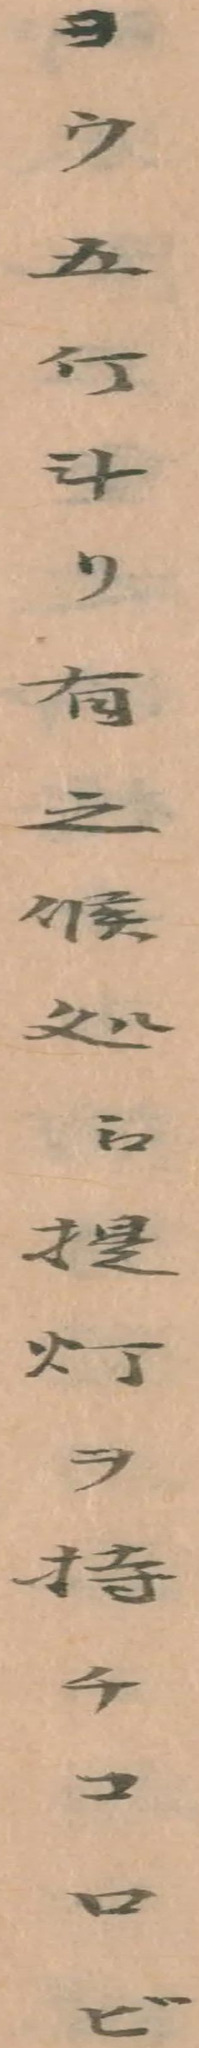ヨウ五仃斗り有之候処江提灯ヲ持チコロビ
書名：地災撮要. 巻1(噴火山・地震ノ部)
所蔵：国立国会図書館 National Diet Library, JAPAN
